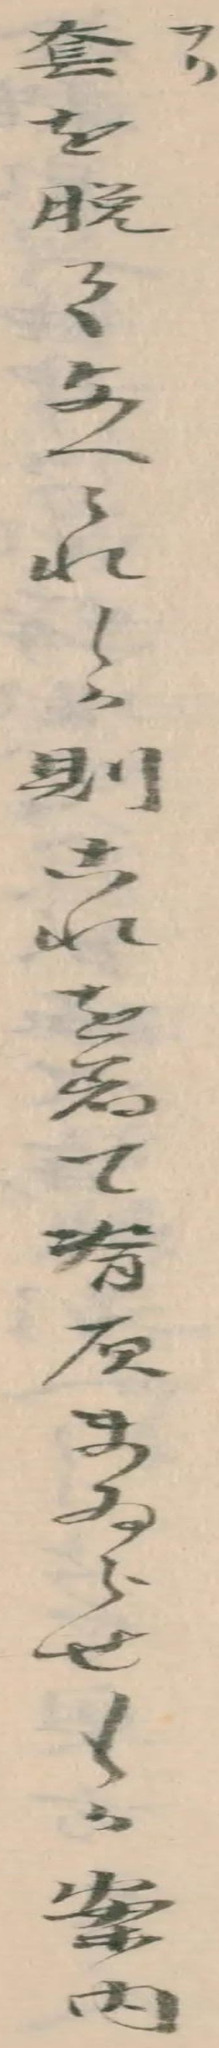套を脱て与へられしか則これを着て背負まゐらせしか案内
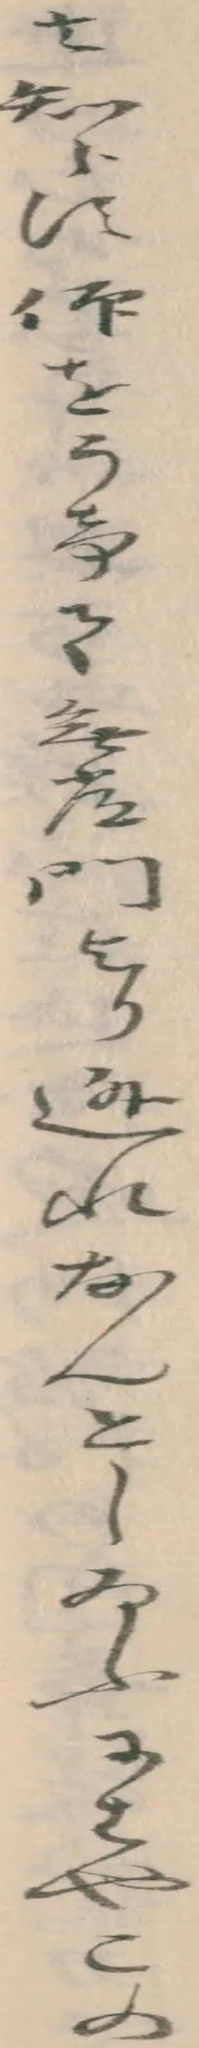は知らす仰をうけて無常門より逃れなんとし給ふにはやこの
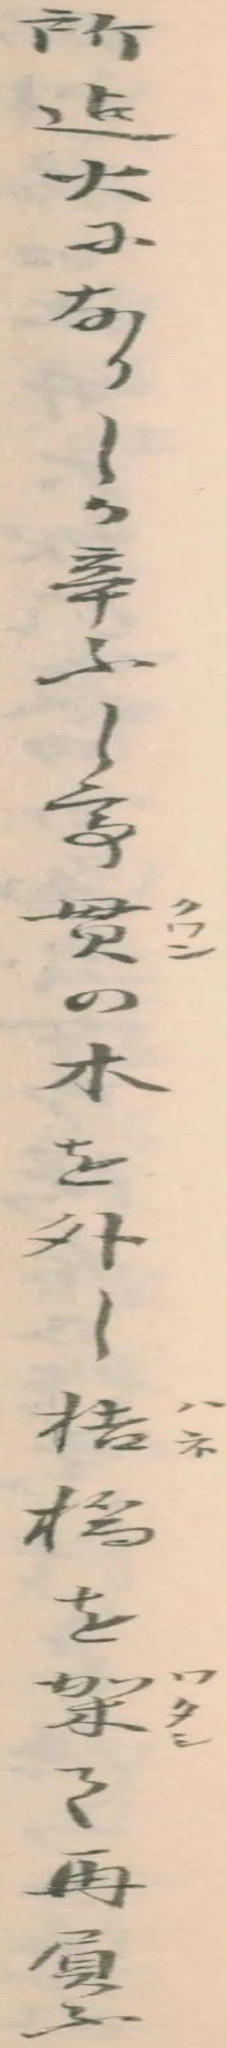所迄火になりしか辛ふして貫の木を外し桔橋を架て再負ふ
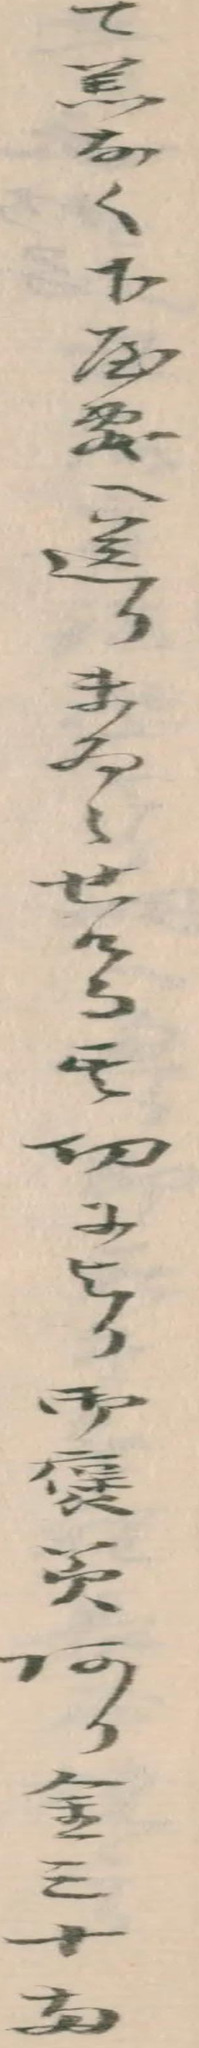て恙なく下屋敷へ送りまゐらせける其功により御褒美あり金三十両
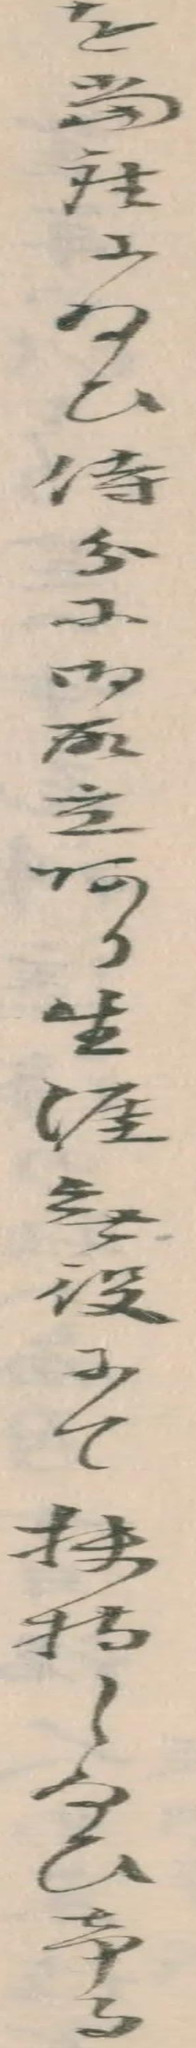を当座に給ひ侍分に御取立あり生涯無役にて扶持し給ひける
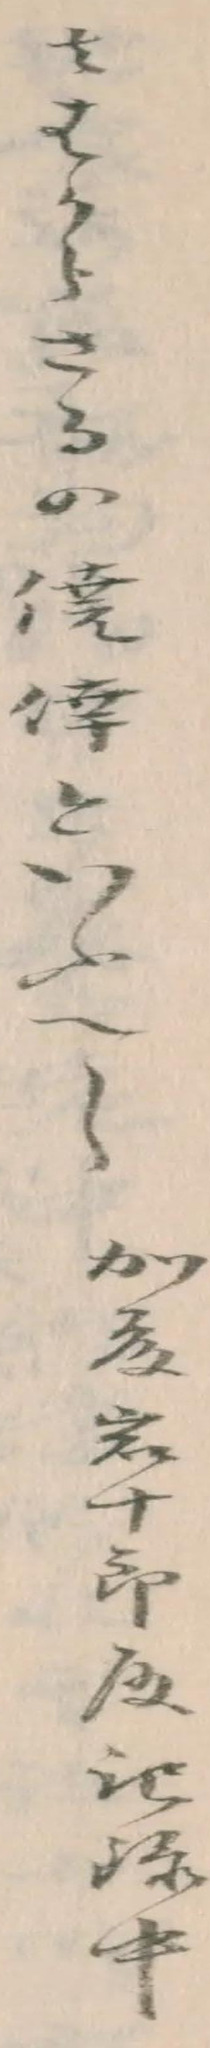ははからさるの僥倖といふへし加藤岩十郎殿記録中
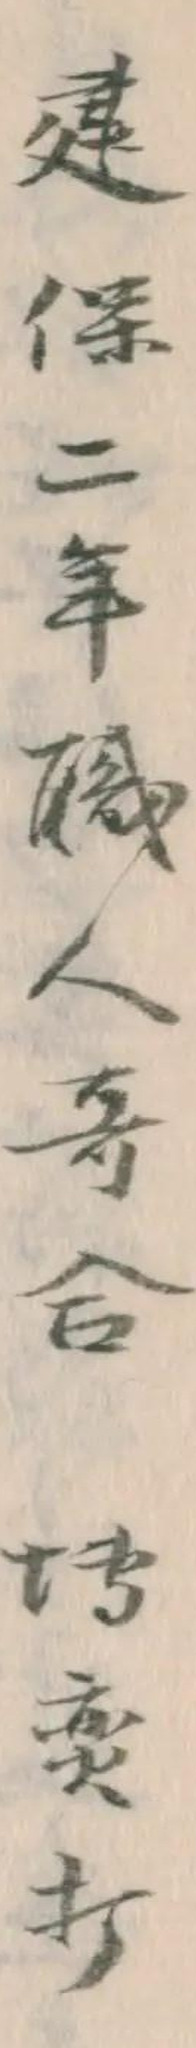建保二年職人哥合博奕打
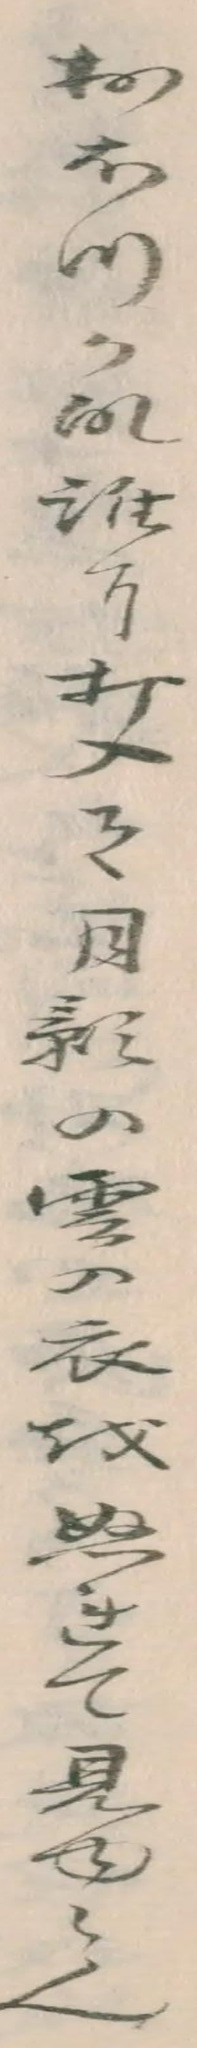おほつかな誰に打入て月影の雲の衣をぬれて見ゆらん
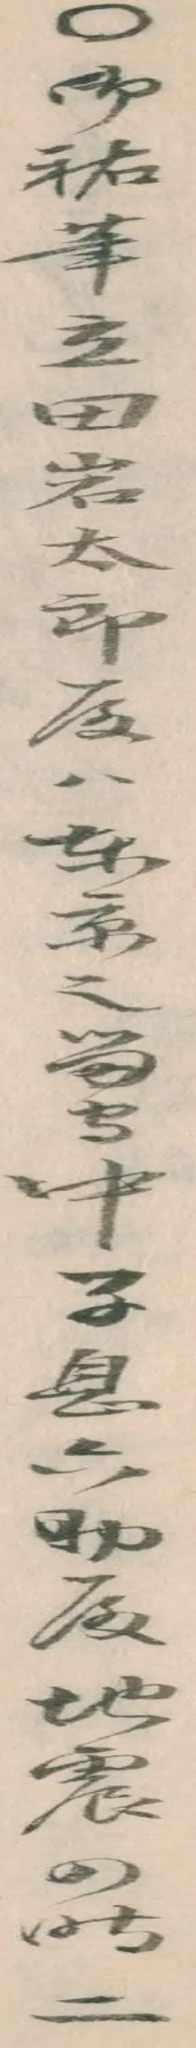〇御祐筆立田岩太郎殿は東京也留守中子息六助殿地震の時二
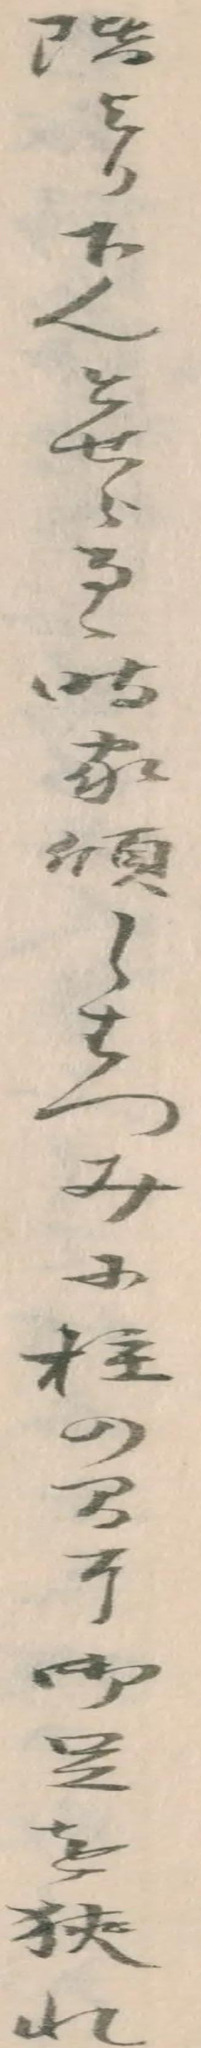階より下んとせらるゝ時家傾しはつみに柱の間に御足を挟れ
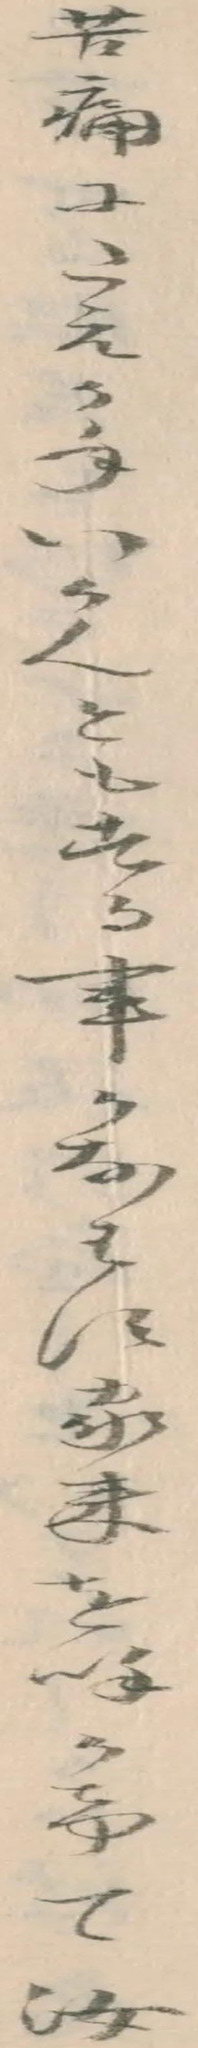苦痛にたえかねいかんともする事かなはす家来を呼かけて汝

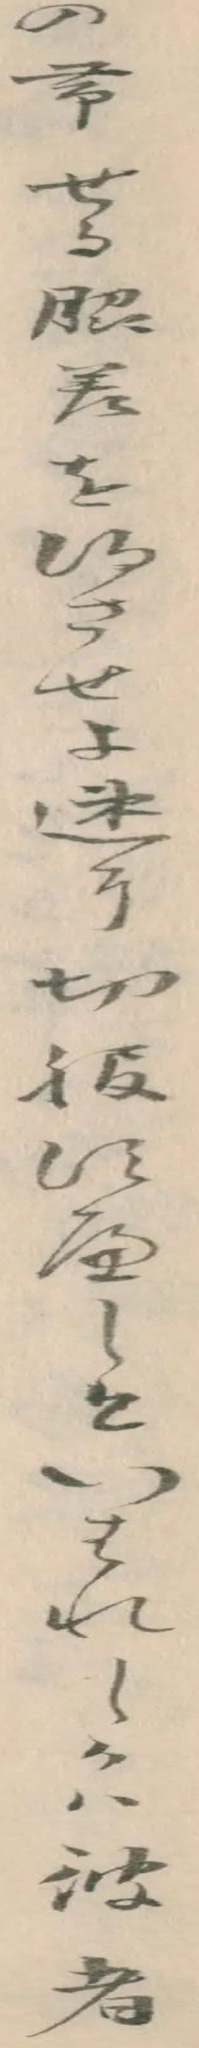の帯せる脇差を得させよ速に切腹すへしといはれしかは彼者
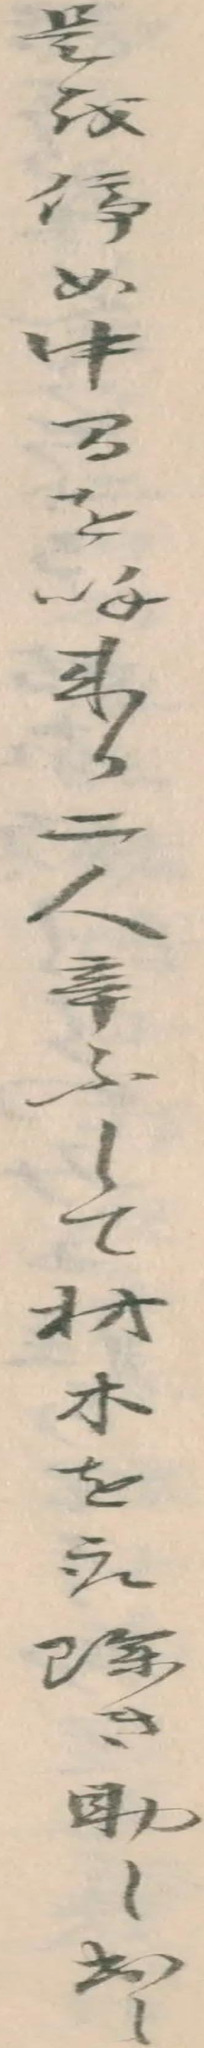是を停め中間を呼来り二人辛ふして材木を取除き助し出し
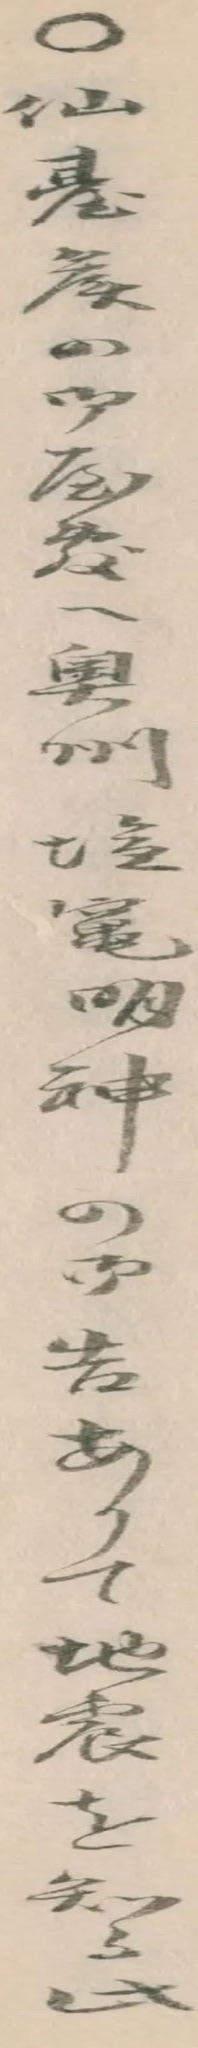〇仙台侯の御屋敷へ奥州塩竃明神の御告ありて地震を知る此
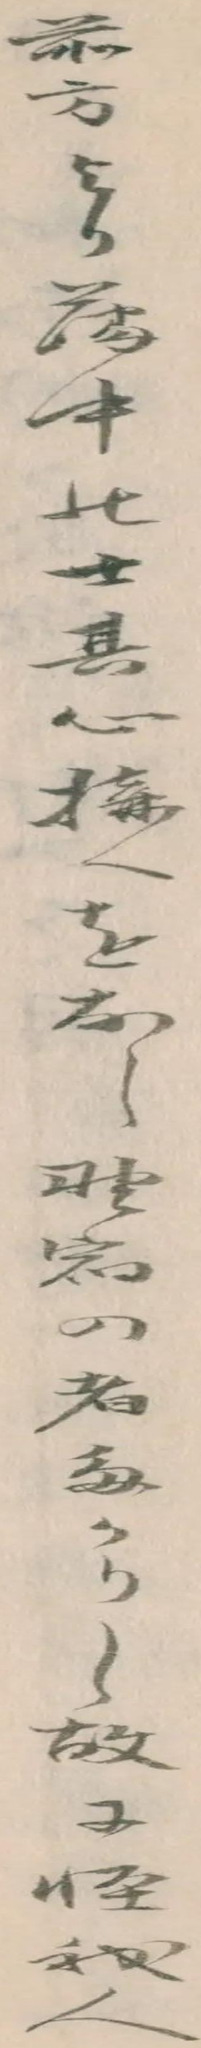前方より藩中の士其心構へをなし野宿の者多かりし故に怪我人
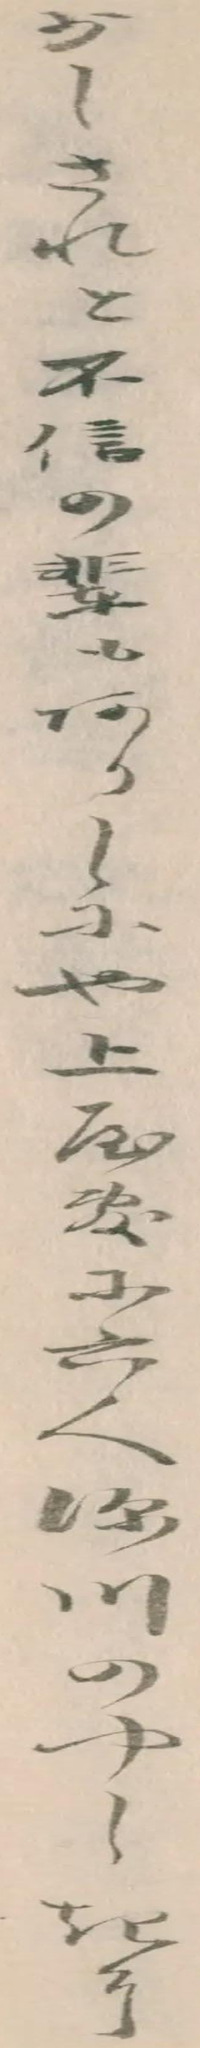少しされと不信の輩もありしにや上屋敷に六人深川のやしきに
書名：地災撮要. 巻10(地震之部) 上,下
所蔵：国立国会図書館 National Diet Library, JAPAN
